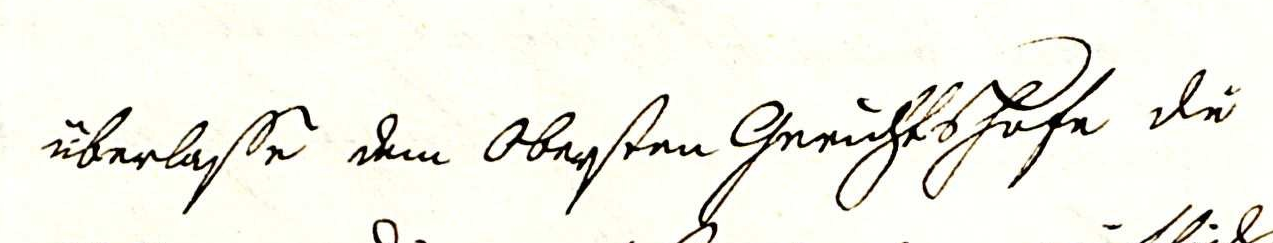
überlasse dem Obersten Gerichtshofe die
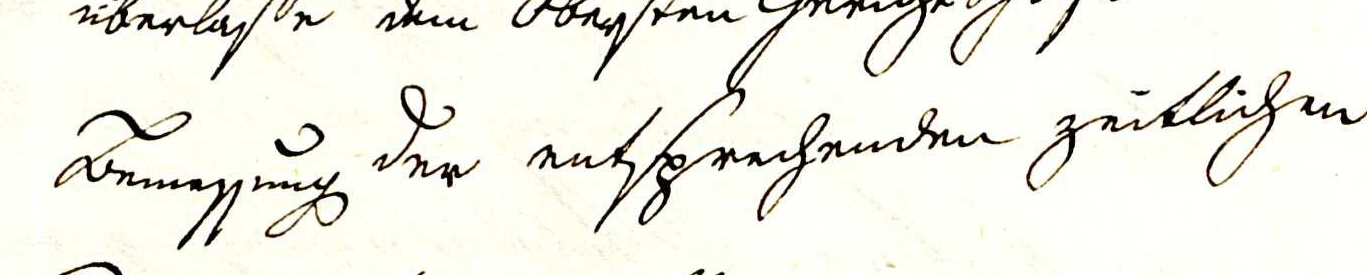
Bemessung der entsprechenden zeitlichen
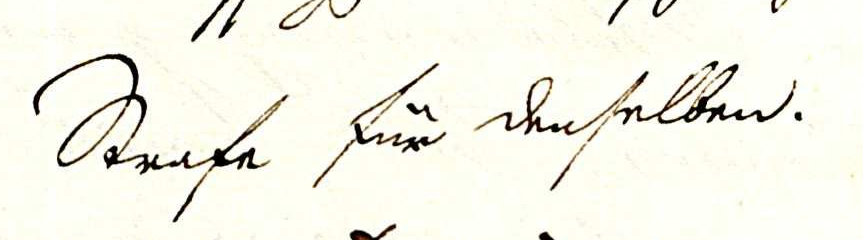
Strafe für denselben.
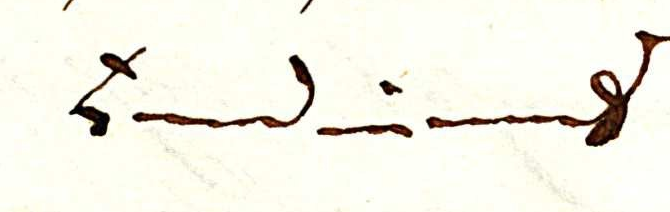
Ferdinand
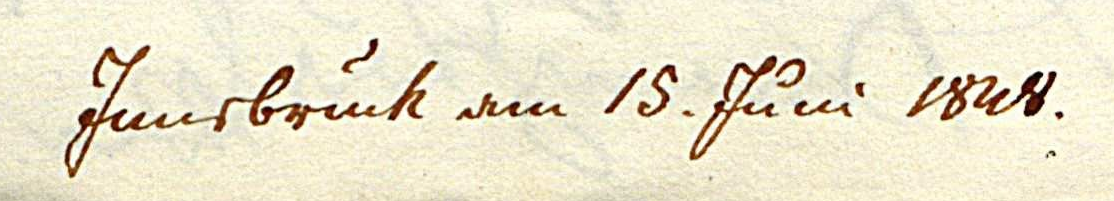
Innsbruck am 15. Juni 1848
